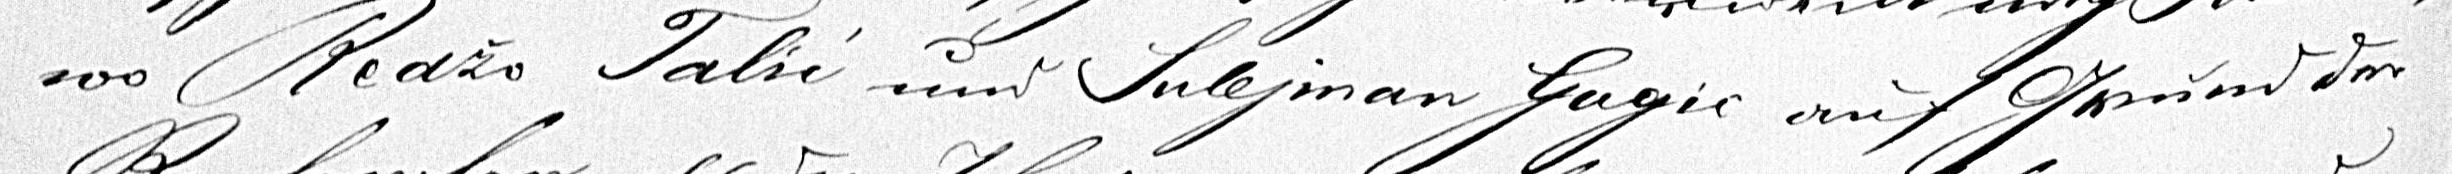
wo Redžo Talić und Sulejman Gogic auf Grund der
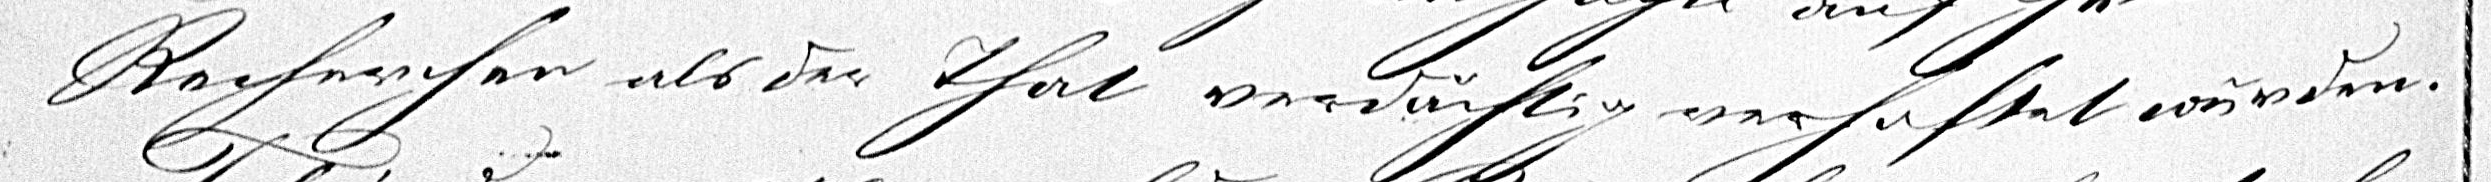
Recherchen als der That verdächtig verhaftet wurden.
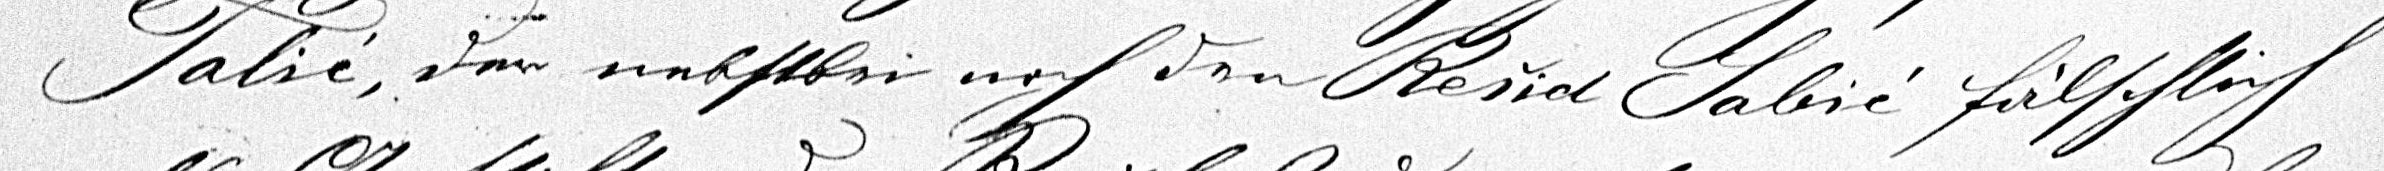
Talić, der nebstbei noch den Rešid Sabić fälschlich
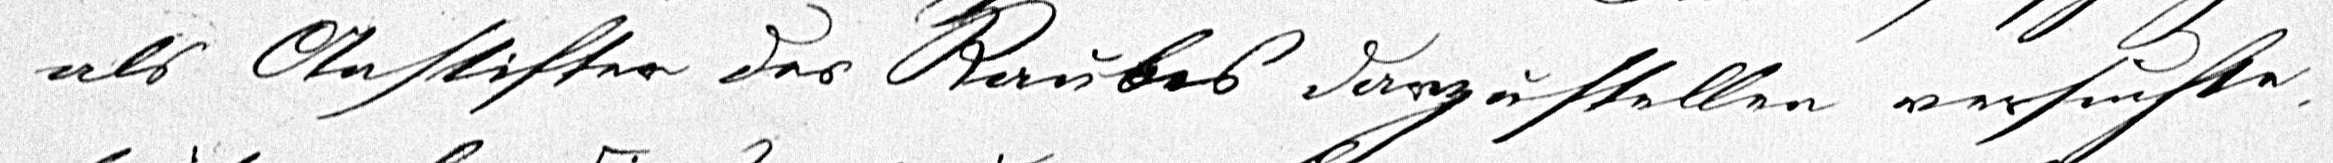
als Anstifter des Raubes darzustellen versuchte
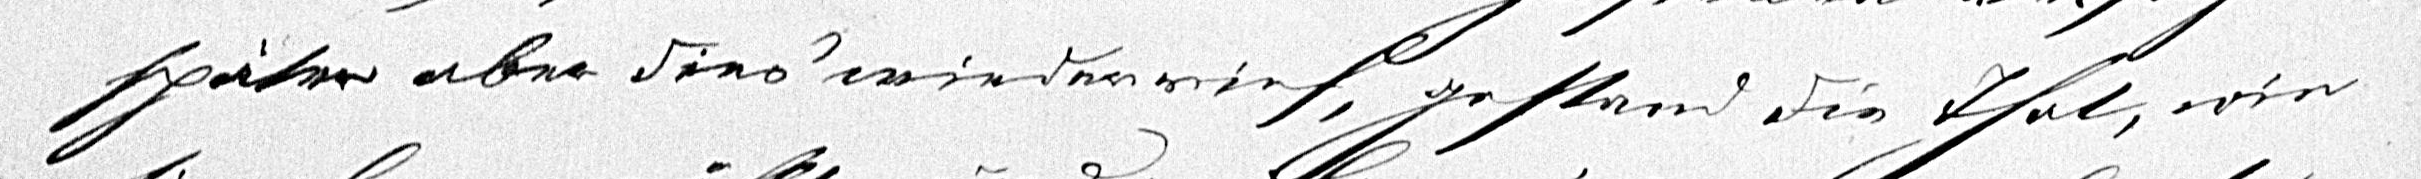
später aber dies wiederrief, gestand die That, wie
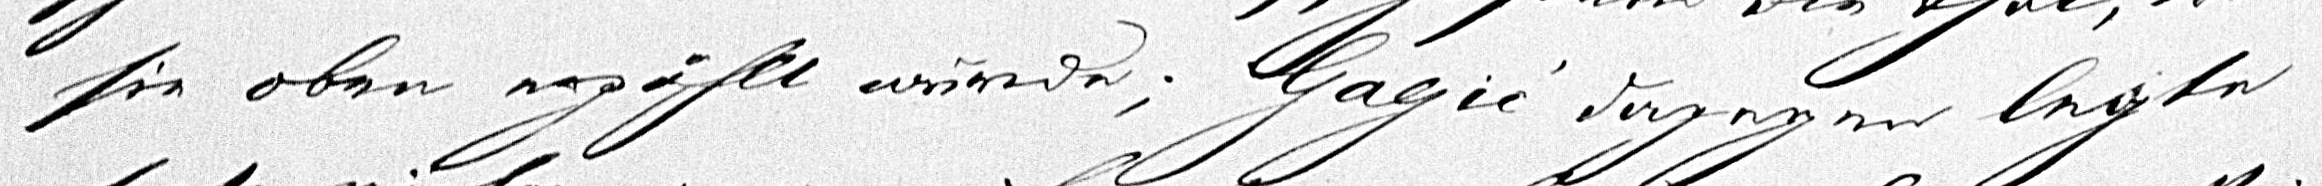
sie oben erzählt wurde; Gagić dagegen legte
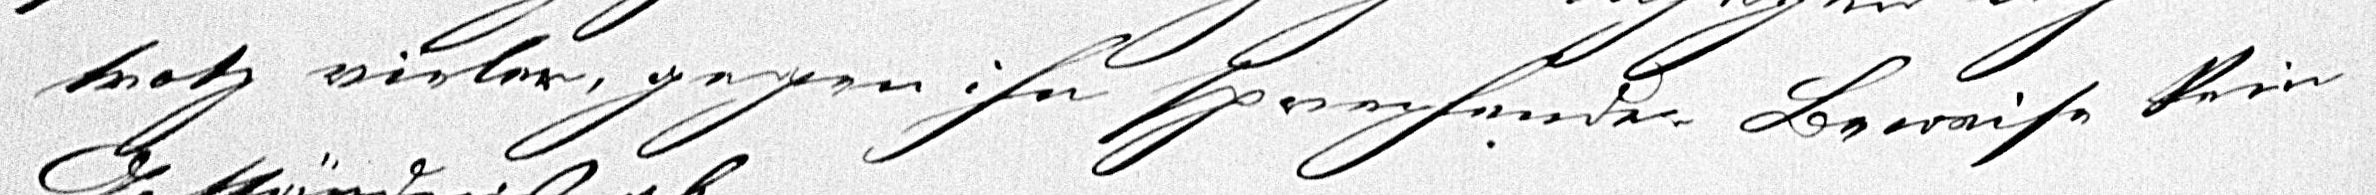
trotz vieler, gegen ihn sprechende. Beweise kein
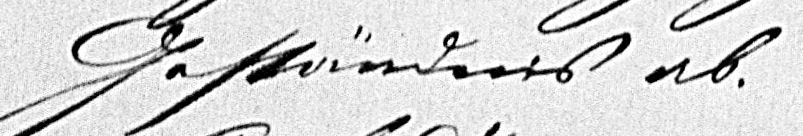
Geständnis ab.
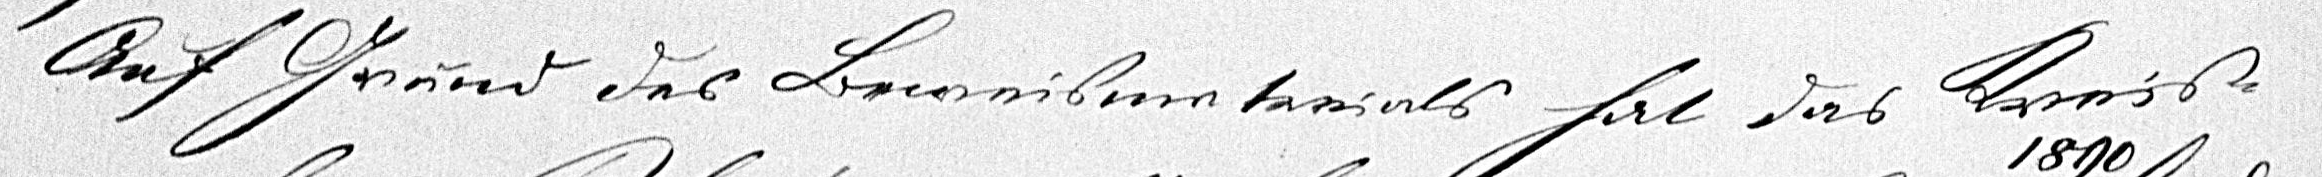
Auf Grund des Beweismaterials hat das Kreis¬
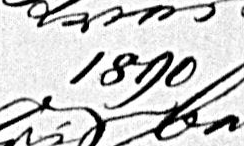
1890
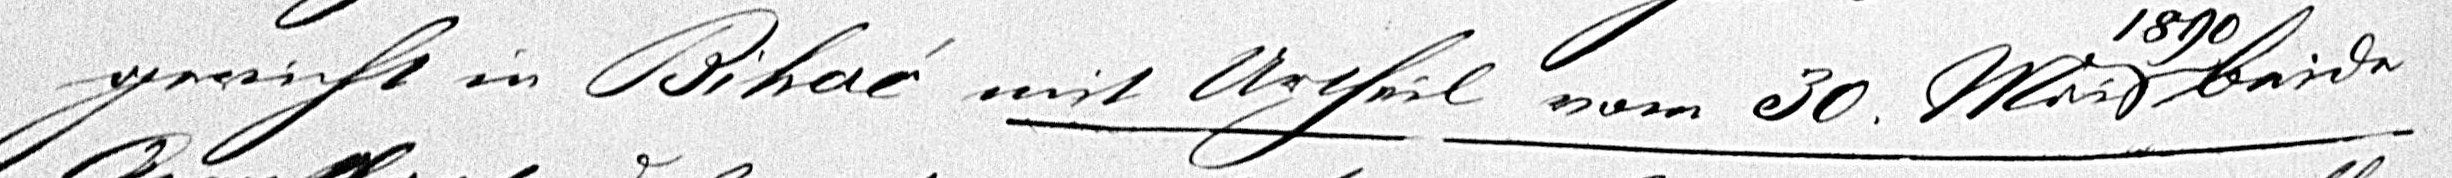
gericht in Bihać mit Urtheil vom 30. Mai beide
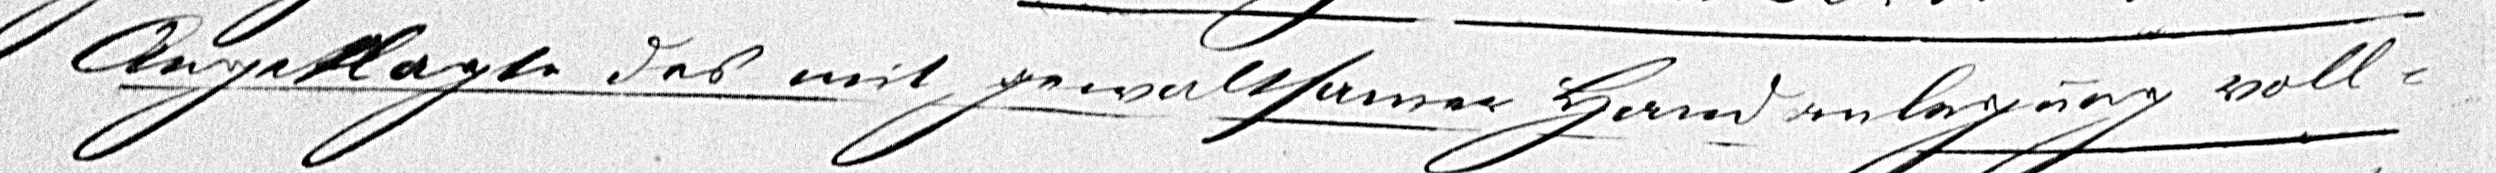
Angeklagte des mit gewaltsamer Handanlegung voll¬
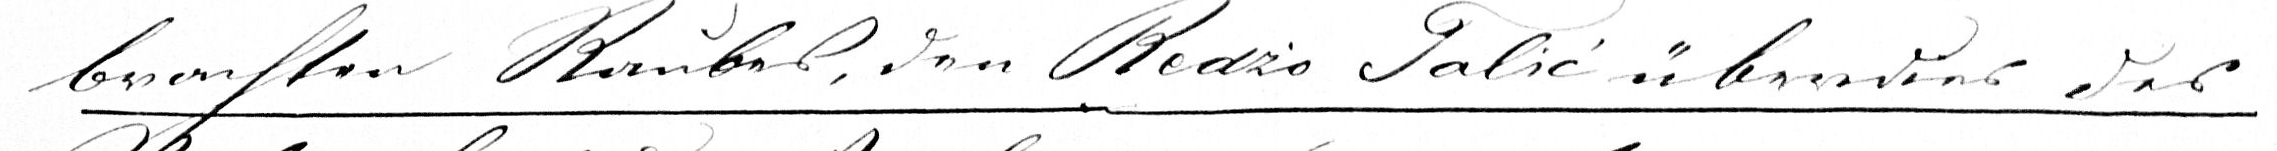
brachten Raubes, den Redžo Talić überdies des
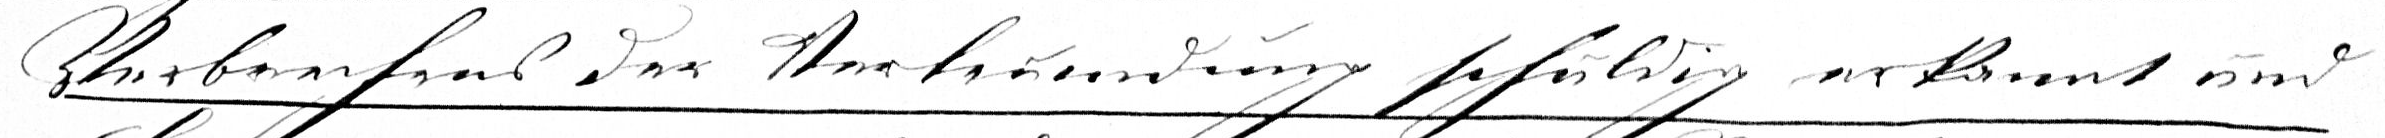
Verbrechens der Verleumdung schuldig erkannt und
